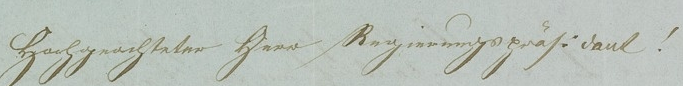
Hochgeachteter Herr Regierungspräsident!
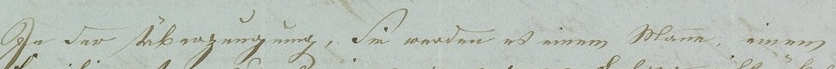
In der Überzeugung, Sie werden es einem Manne, einem
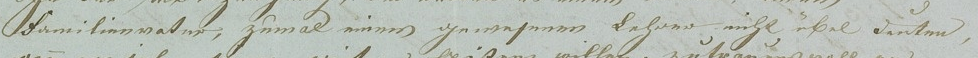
Familienvater, zumal einem gewesenen Lehrer nicht übel deuten,
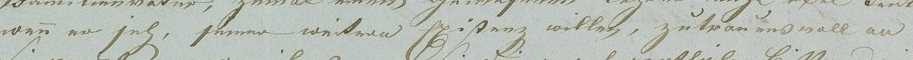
wenn er sich, seiner weitern Existenz willen, zutrauensvoll an
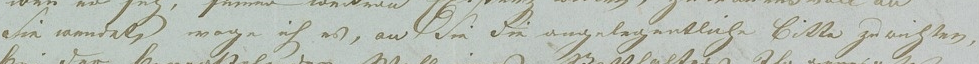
Sie wendet, wage ich es, an Sie die angelegentliche Bitte zu richten,
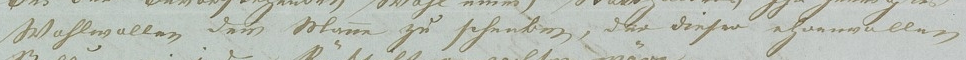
Wohlwollen dem Manne zu schenken, der dieser ehrenvollen
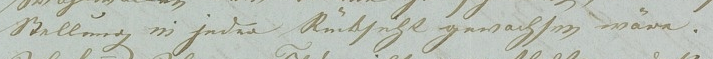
Stellung in jeder Rücksicht gewachsen wäre.
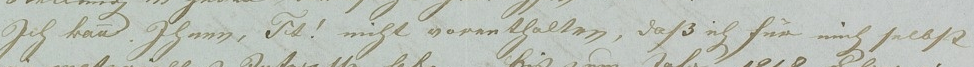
Ich kann Ihnen, Tit! nicht vorenthalten, daß ich für mich selbst
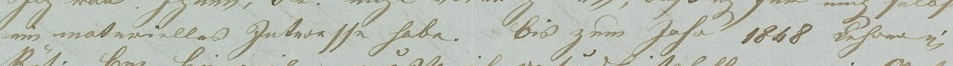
ein materielles Interesse habe. Bis zum Jahr 1848 Lehrer in
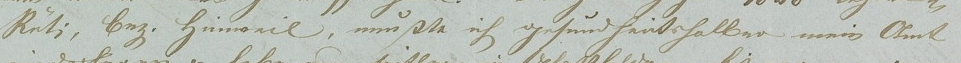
Rüti, Bez. Hinweil, mußte ich gesundheitshalber mein Amt
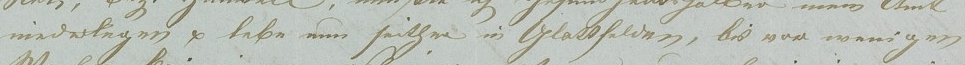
niederlegen & lebe nun seither in Glattfelden, bis vor wenigen
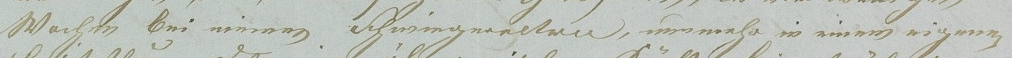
Wochen bei meinen Schwiegereltern, nunmehr in einem eigenen
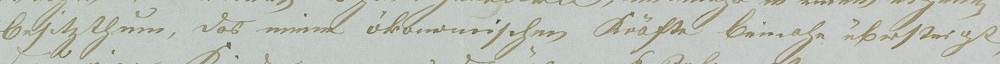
Besitzthum, das meine ökonomischen Kräfte beinahe übersteigt,
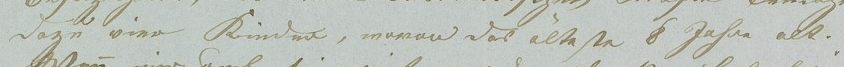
dazu vier Kinder, wovon das älteste 8 Jahre alt.
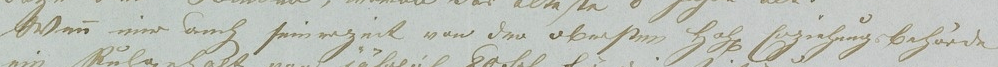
Wenn mir auch seinerzeit von der obersten Hohen Erziehungsbehörde
